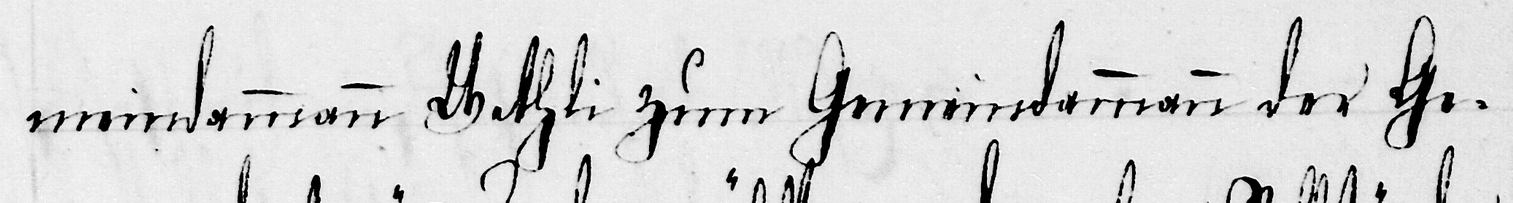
meindammann Wethli zum Gemeindammann der Ge¬
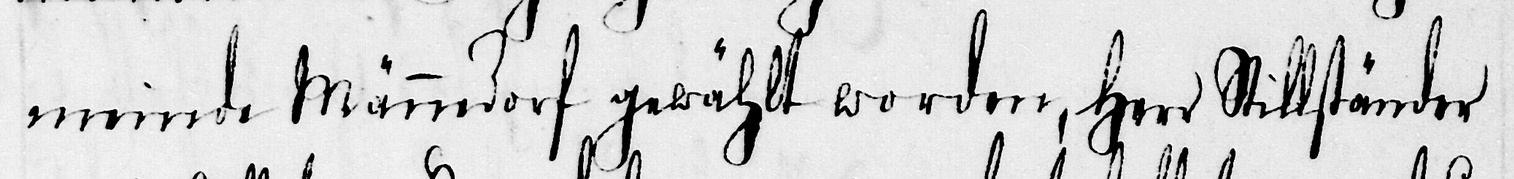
meinde Männedorf gewählt worden, Herr Stillständer
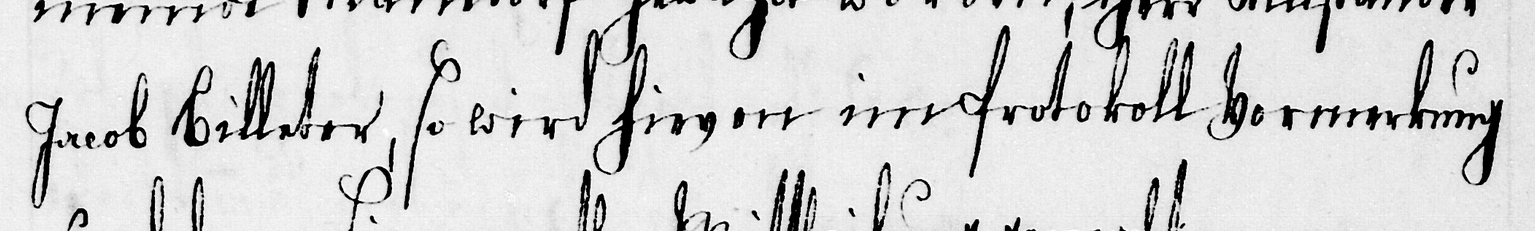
Jacob Billeter, so wird hievon im Protokoll Vormerkung
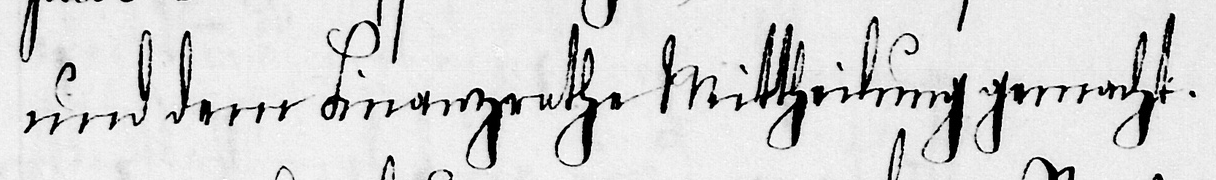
und dem Finanzrathe Mittheilung gemacht.
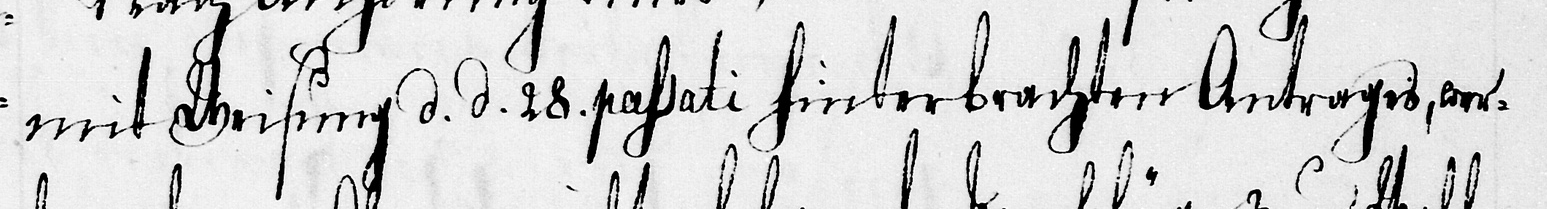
mit Weisung d. d. 28. passati hinterbrachten Antrages, wer¬
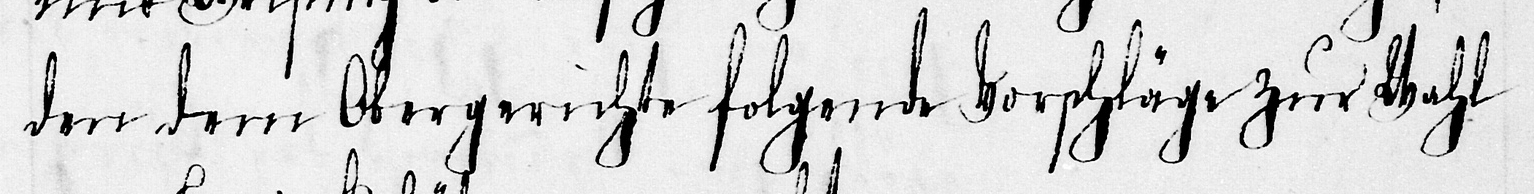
den dem Obergerichte folgende Vorschläge zur Wahl
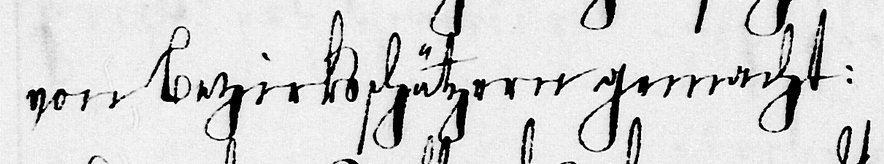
von Bezirksschätzern gemacht:
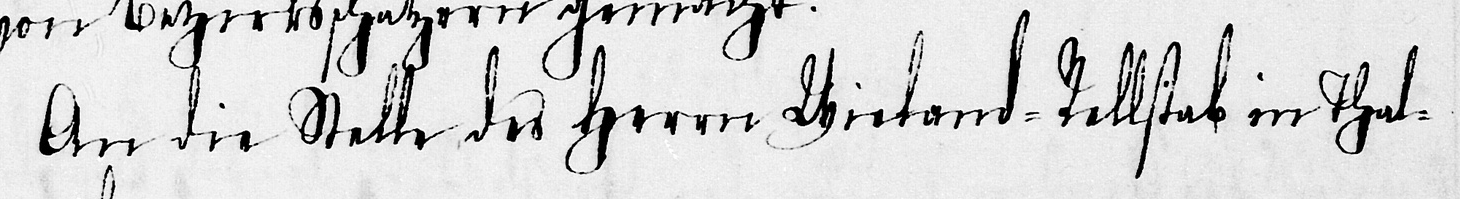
An die Stelle des Herrn Wieland-Rellstab in Thal¬
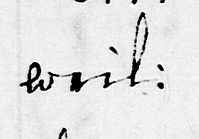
weil:
